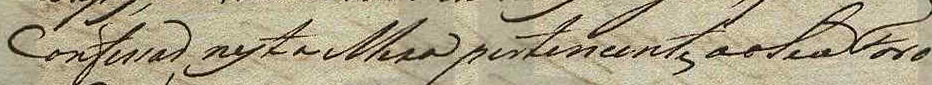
Confessar nesta Meza pertencente ao Seu Foro
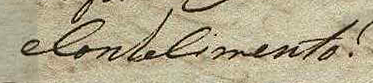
e ConheCimento?
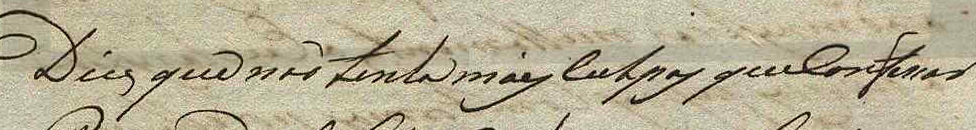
Dice que naõ tinha mais culpas que Confessar
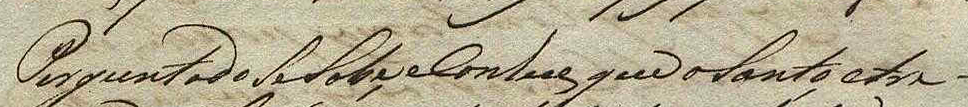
Perguntado se Sabe, e Conhece que o Santo e tre
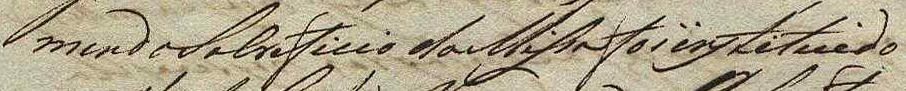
mendo SaCrificio da Missa foi instituido
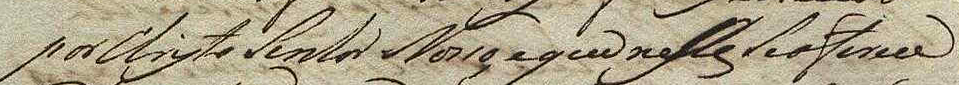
por Christo Senhor Nosso, e que nelle se oferece
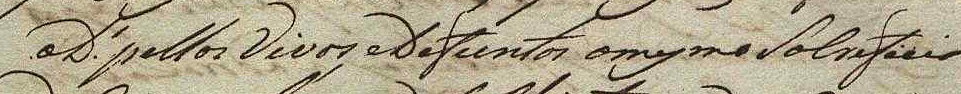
a D̄ pellos Vivos e Defuntos o mesmo SaCreficio
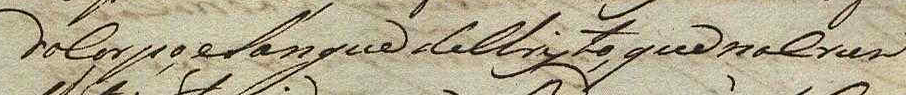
do Corpo, e Sangue de Christo, que na Cruz
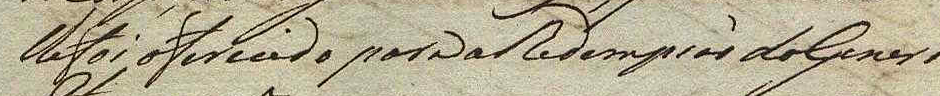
lhe foi oferecido para a Redempsaõ do Genero
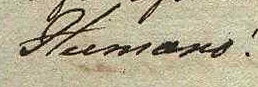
Humano?
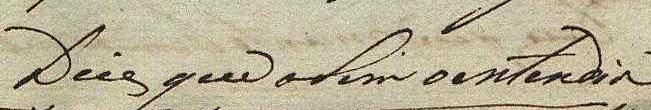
Dice que aSim o entendia
